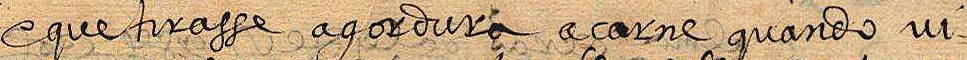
e que tirasse a gordura a carne quando ui
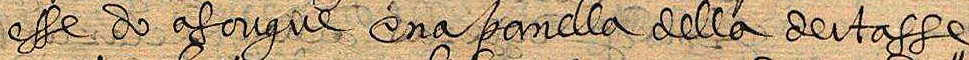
esse do asougue e na panella della deitasse
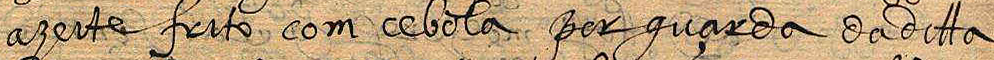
azeite frito com cebola per guarda da ditta
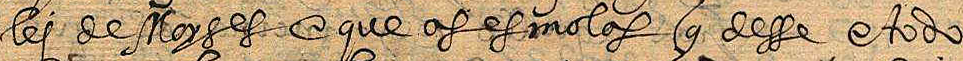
lej de Moyses e que as esmolas q̄ desse e todo
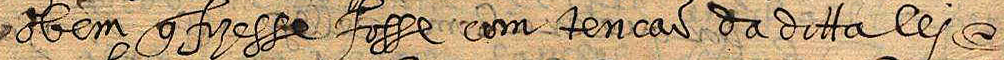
o bem q̄ fizesse fosse com tençaõ da ditta lej e
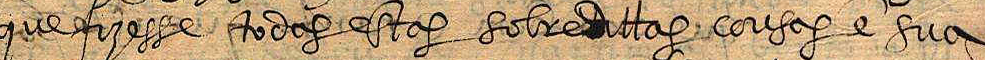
que fizesse todas estas sobredittas cousas ē sua
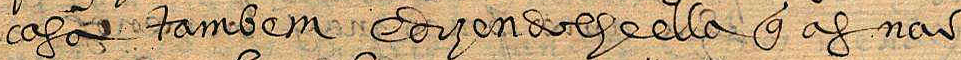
casa tambem e dizendolhe ella q̄ as naõ
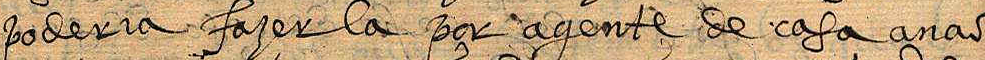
poderia fazer la por a gente de casa a naõ
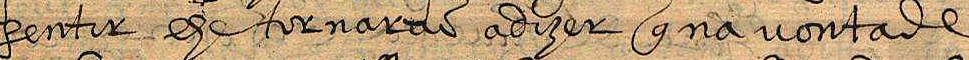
sentir lhe tornaraõ a dizer q̄ na uontade
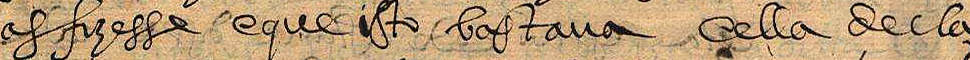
as fizesse e que isto bastaua e ella decla
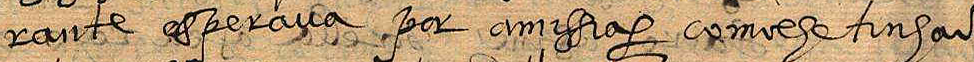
rante esperaua por o missias como lhe tinhaõ
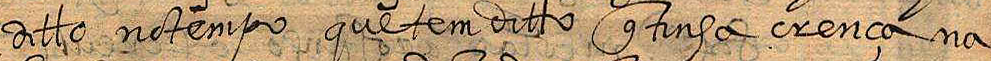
ditto no tempo que tem ditto q̄ tinha crença na
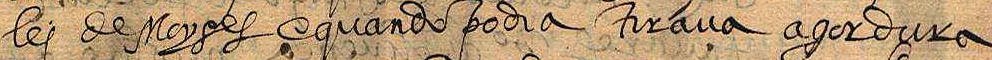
lej de Moyses e quando podia tiraua a gordura
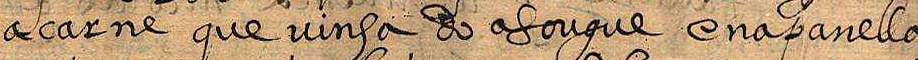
a carne que uinha do asougue e na panella
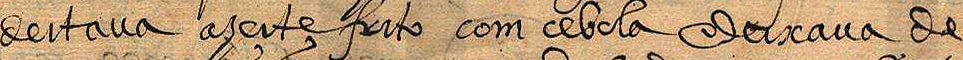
deitaua azeite frito com cebola e deixaua de
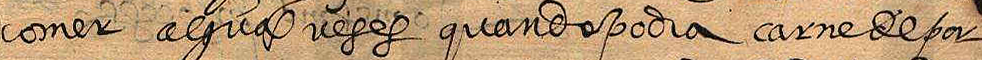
comer algūas ueses quando podia carne de por
